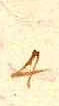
4
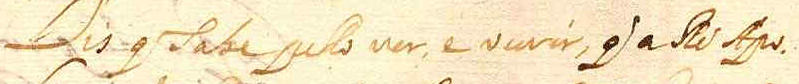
Dis q̄ sabe pelo ver e ouvir, q̄ a Ré Apo
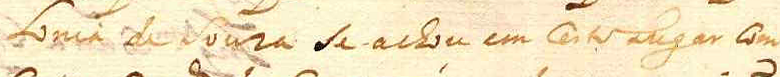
Lonia de souza se achou em certo Lugar com
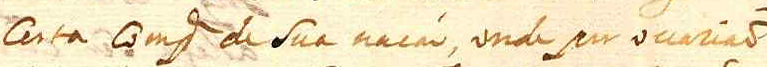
certa compa de sua naçaõ, onde por occaziaõ
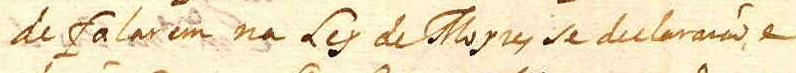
de falarem na Ley de Moyzes se declararaõ, e
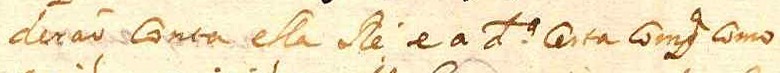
deraõ conta ella Ré e a d̄.a certa compa como
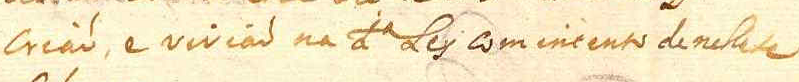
criaõ, e viviaõ na d̄a Ley com intento de nella se
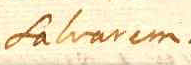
salvarem.
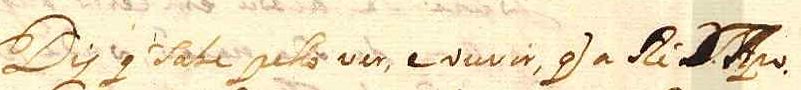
Dis q̄ sabe pelo ver, e ouvir, q̄ a Ré _ Apo
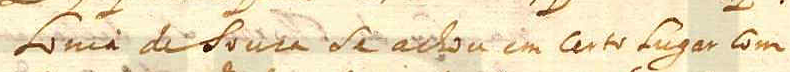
Lonia de Souza se achou em certo Lugar com
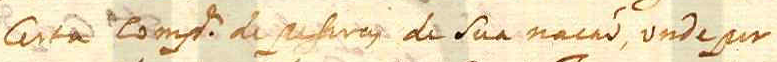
certa comp.a de pessoaas de sua naçaõ, onde por
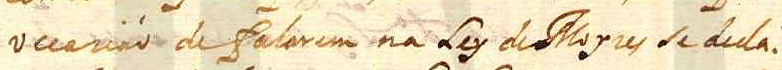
occaziaõ de falarem na Ley de Moyzes se decla
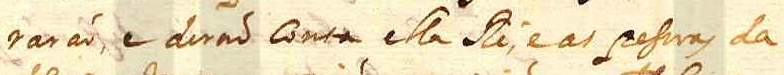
raraõ, e deraõ conta ella Ré, e as pessoas da
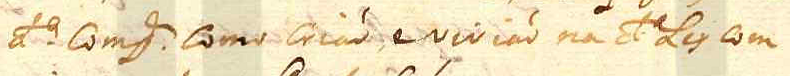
d̄.a comp.a como criaõ, e viviaõ na d̄.a Ley com
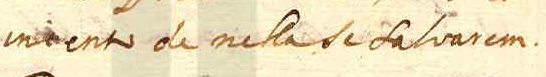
intento de nella se salvarem.
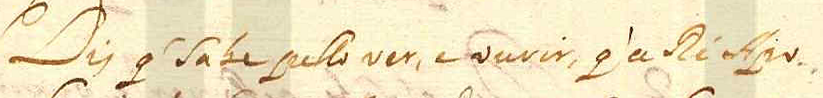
Dis q̄ sabe pello ver, e ouvir, q̄ a Ré Apo
